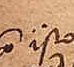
cō isto
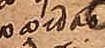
cocordão
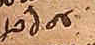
todos
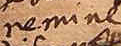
nemine
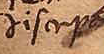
discepāt
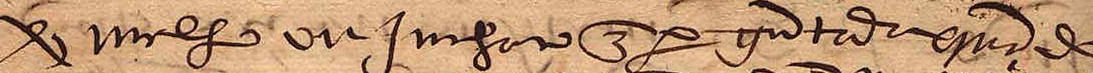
ꝟmelho ou Jnchaco item ꝑgūtada quādo
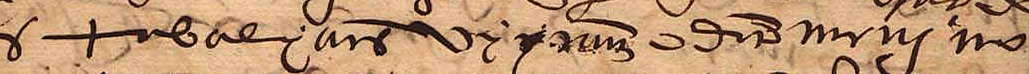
os tabalyaẽs vyyram o dito menjno
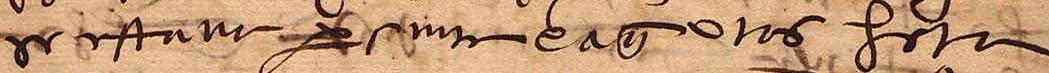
se estaua ꝑsemte e a q̄ oras hera
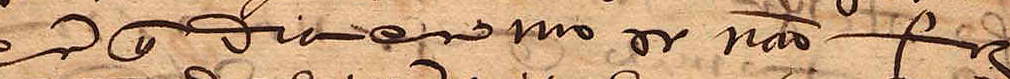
e ē q̄ dia e como se não fez
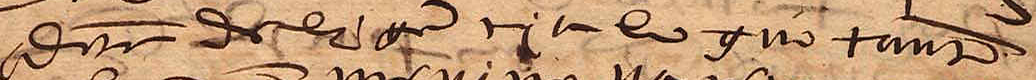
a dita delygēcya loguo tanto
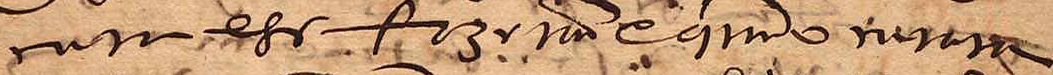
cura lhe fizerão e quē o curara
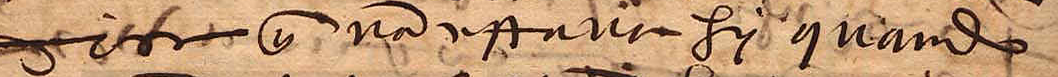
dise q̄ nā estaua hy quando
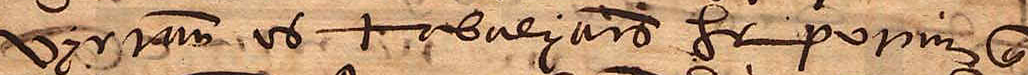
vyeran̄ os tabalyães he porem q̄
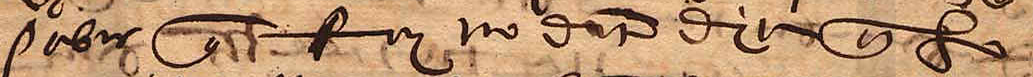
sabee q̄ foy no dito dya q̄ ho
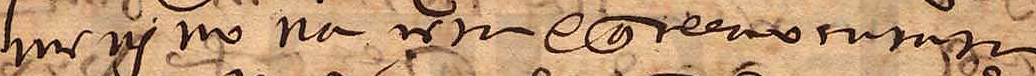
menjno naçera e q̄ ella o curara
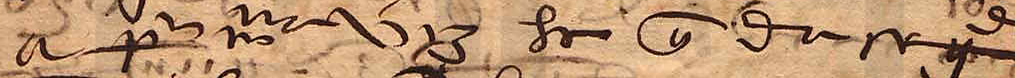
a prmra vez he q̄ da segda
